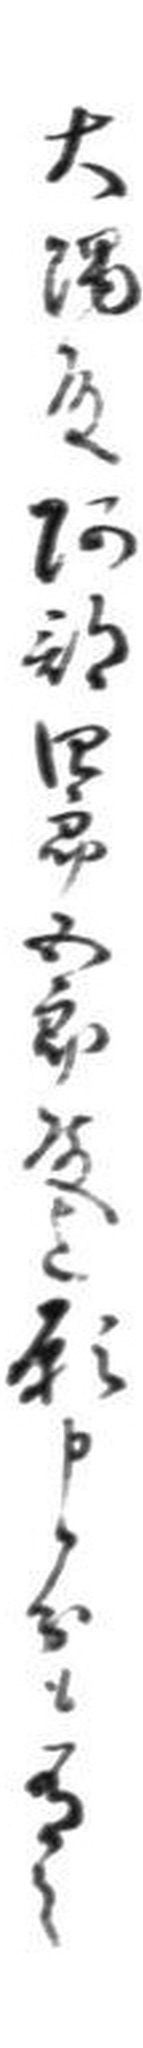大隅殿阿部四郎五郎殿迄願申分も有之
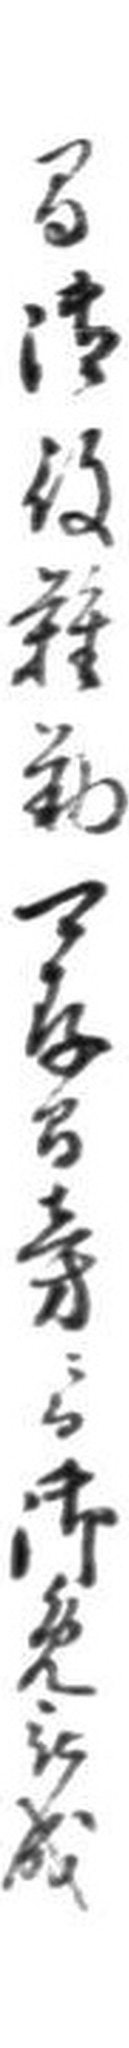間御役難勤可存間旁ニ而御免被成
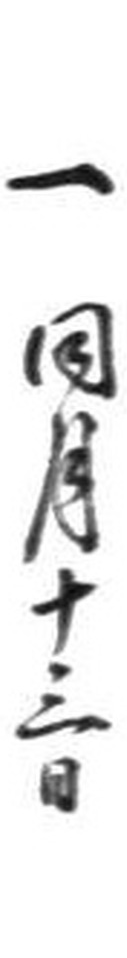一同月十三日

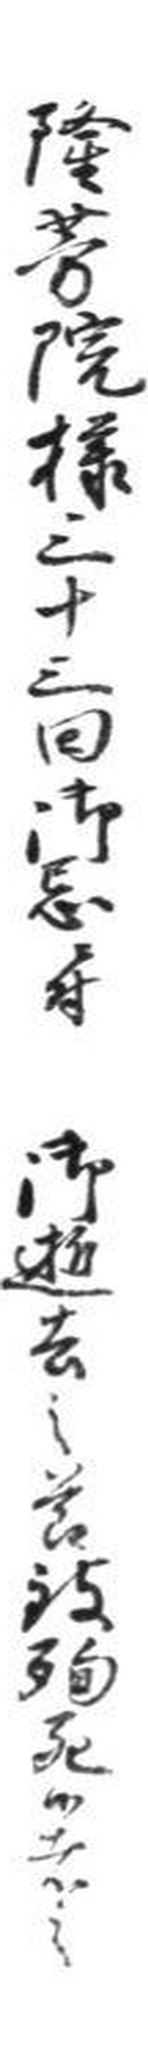隆芳院様三十三かい回御忌ニ付御逝去之節致殉死候者之
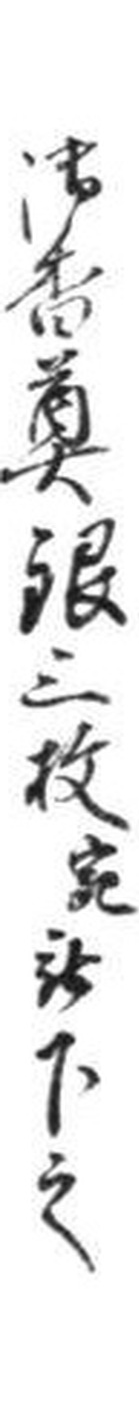御香奠銀三枚宛被下之
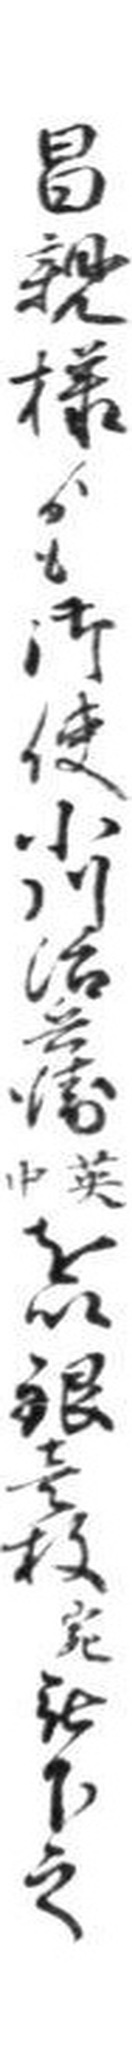昌親様ゟも御使小川治兵衛英中を以銀壱枚宛被下之
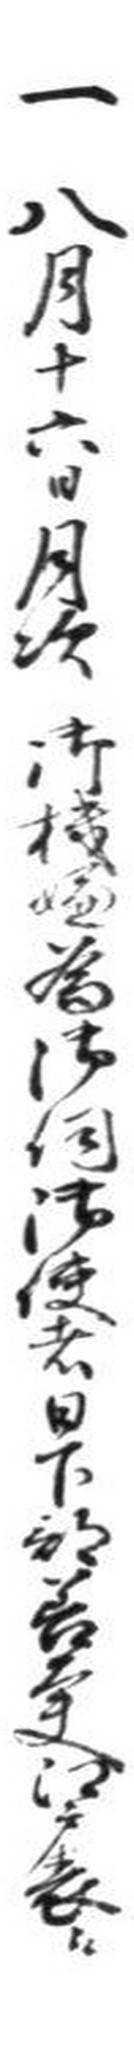一八月十六日月次御機嫌為御伺御使者日下部善大夫江戸表江
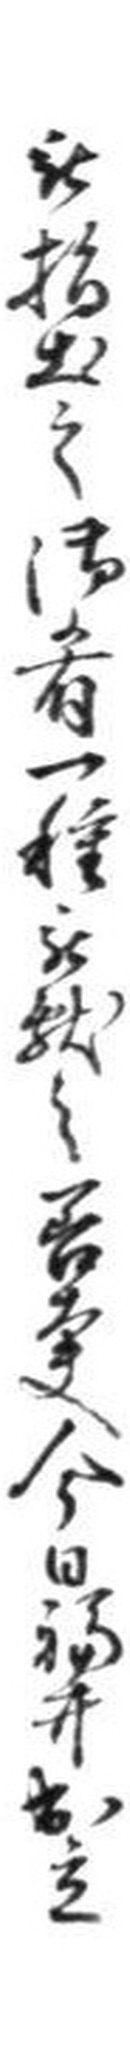被指出之御肴一種被献之善大夫今日福井出立
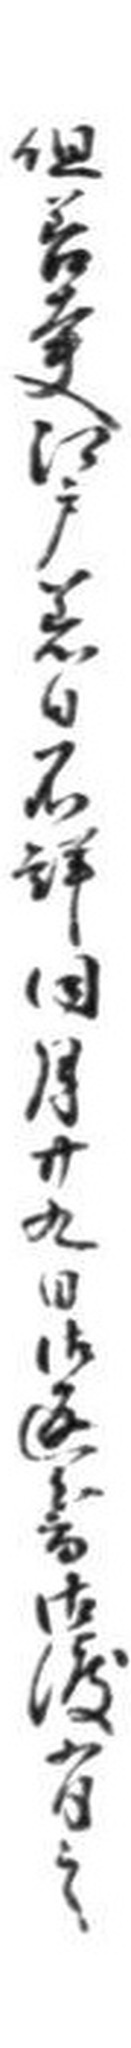但善大夫江戸着日不詳同月廿九日御返書御渡有之
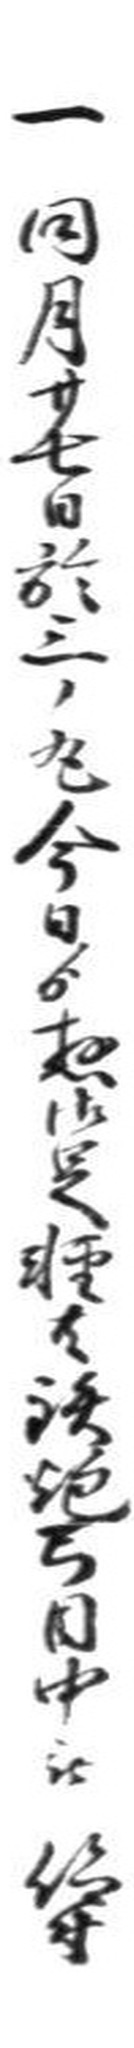一同月廿七日於三ノ丸今日ゟ惣御足軽共鉄砲弓日中被仰付
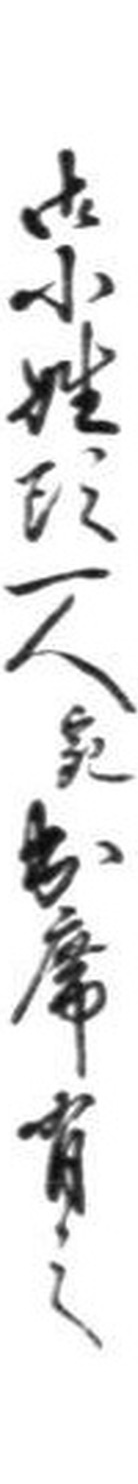御小姓頭一人宛出席有之
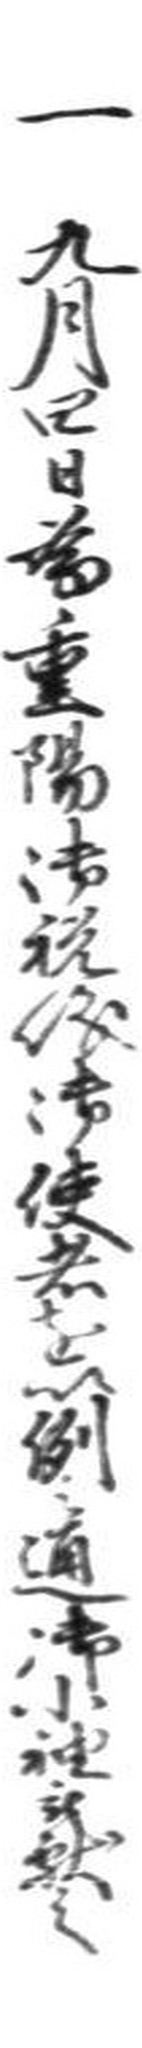一九月四日為重陽御祝儀御使者を以例之通御小袖被献之
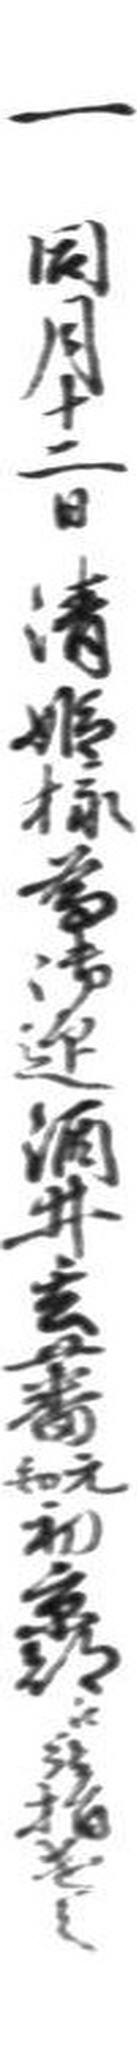一同月十二日清姫様為御迎酒井玄蕃元知初京都江被指遣之
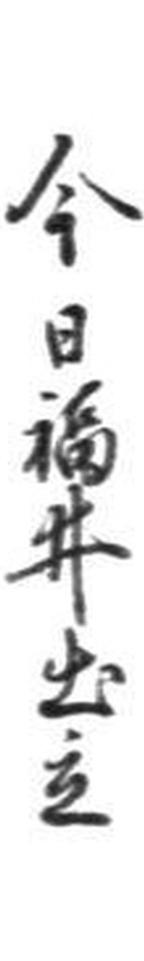今日福井出立
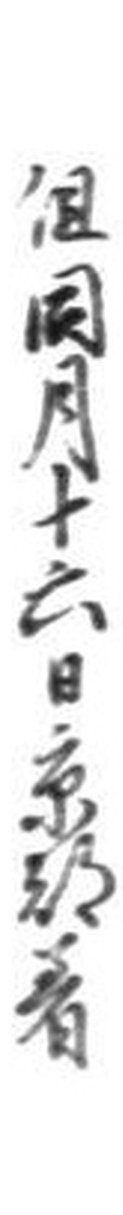但同月十六日京都着
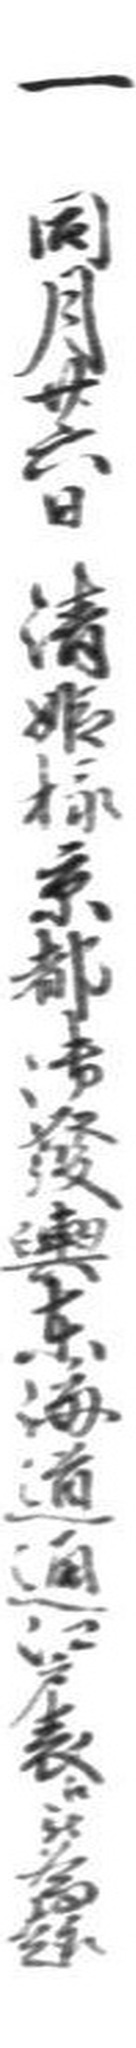一同月廿六日清姫様京都御発輿東海道通江戸表江被為趣
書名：家譜 十三 綱昌公 従寛文元年到延宝五年
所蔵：福井県文書館 Fukui Prefectural Archives
